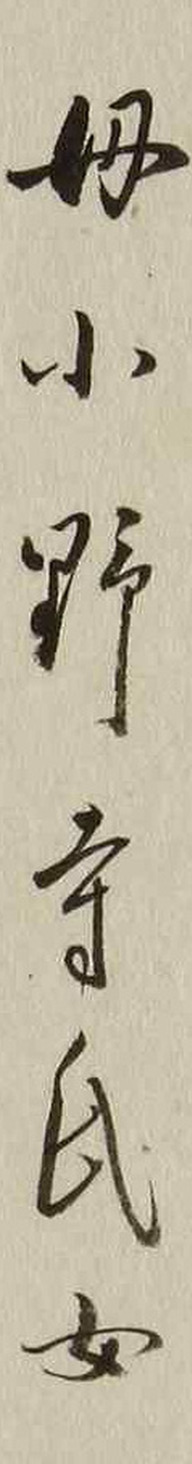母小野寺氏女
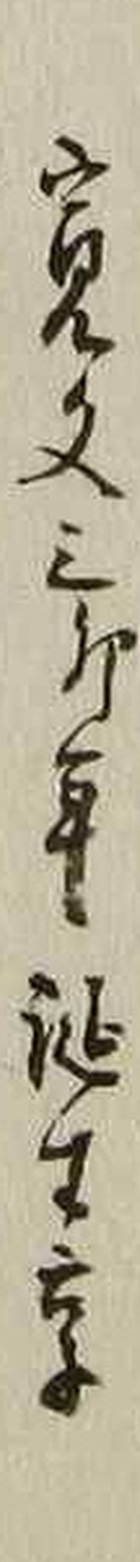寛文三卯年誕生享
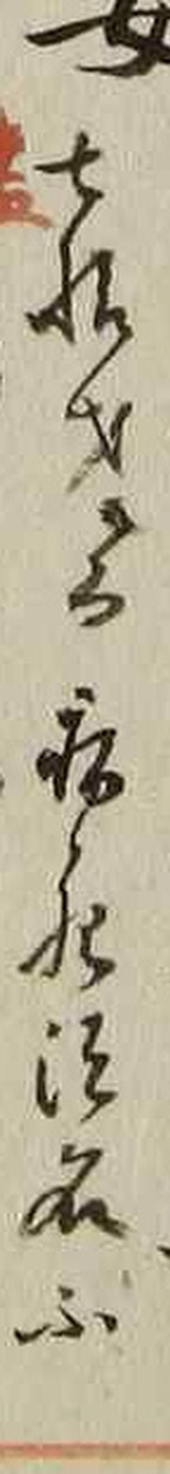七拾才に而病死法名不
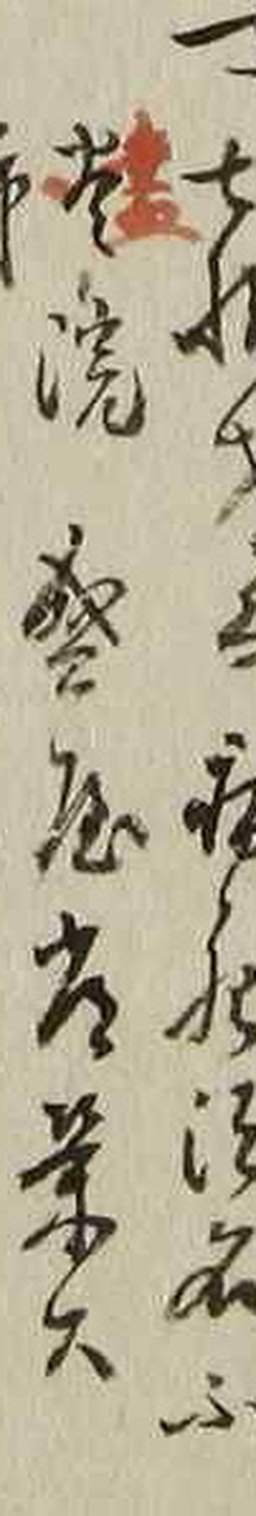盡院盛屋常栄大
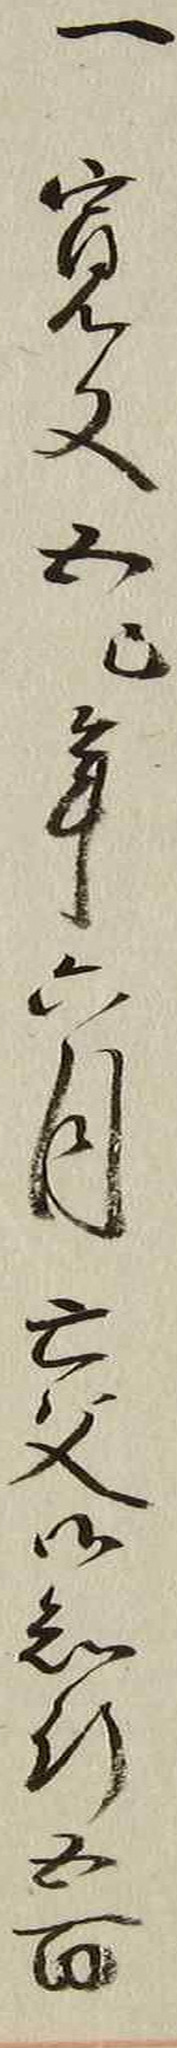一寛文五巳年六月亡父御知行五百
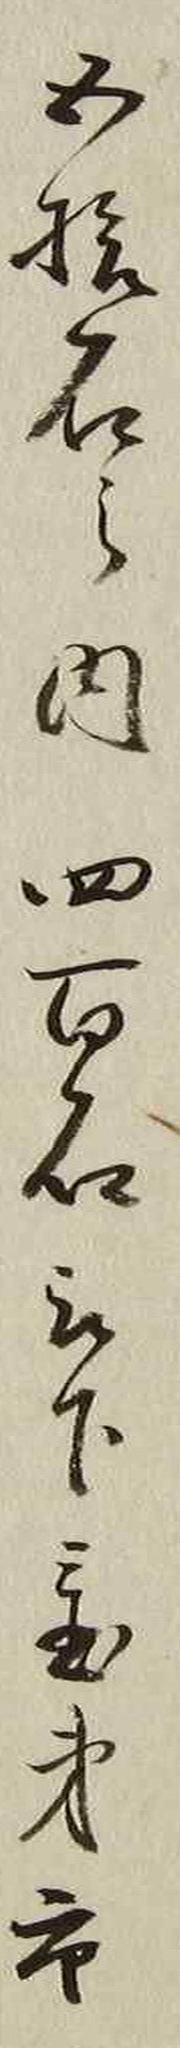五拾石之内四百石被下置第市
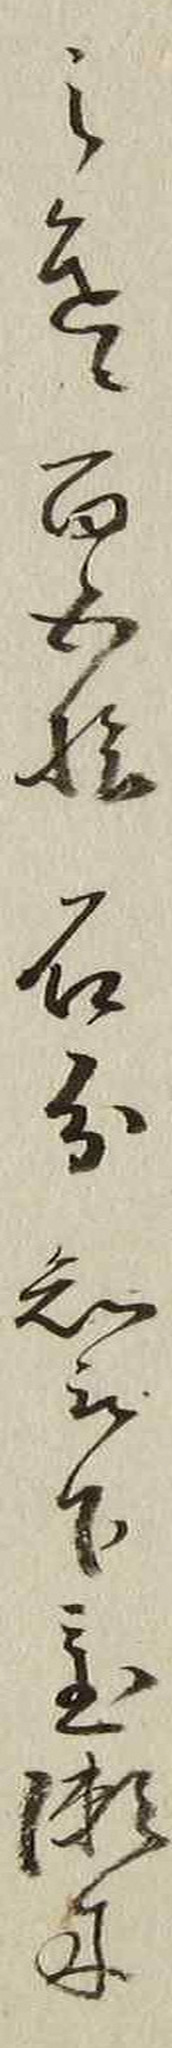之進へ百五拾石分知被下置瀬來
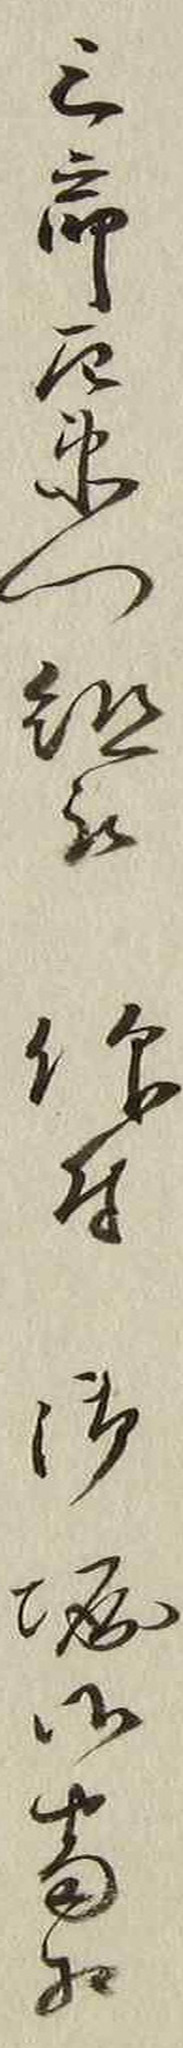三郎左衛門組被仰付御堀御番相
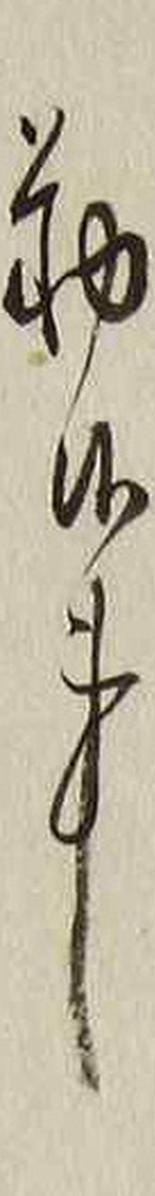勤候事
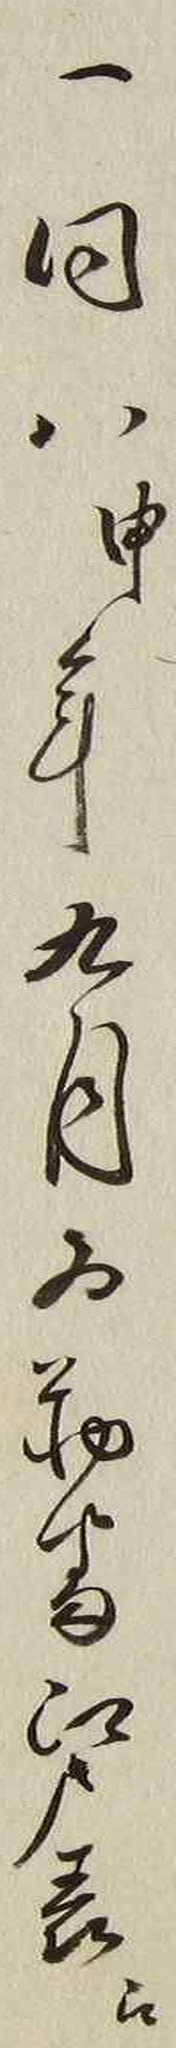一同八申年九月為勤番江戸表江
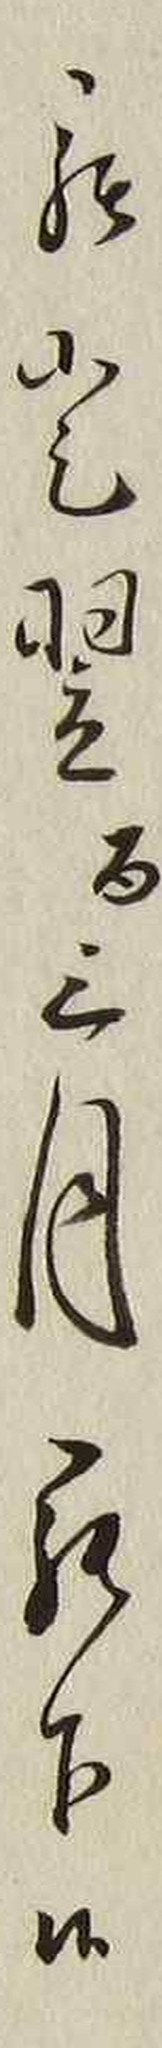罷登翌酉三月罷下候
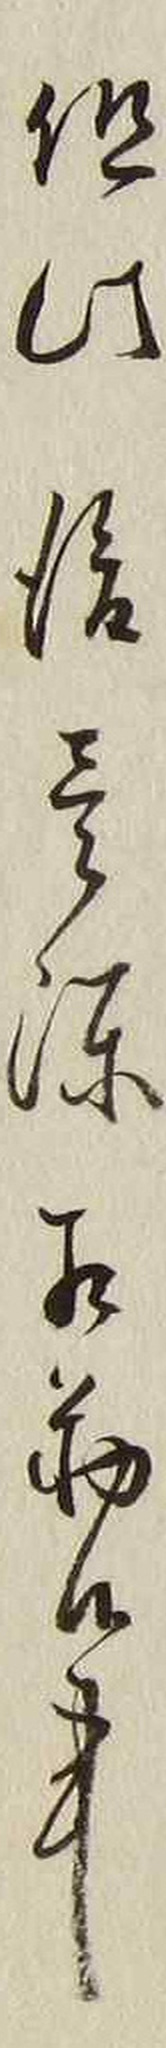但此後壱陣相勤候事
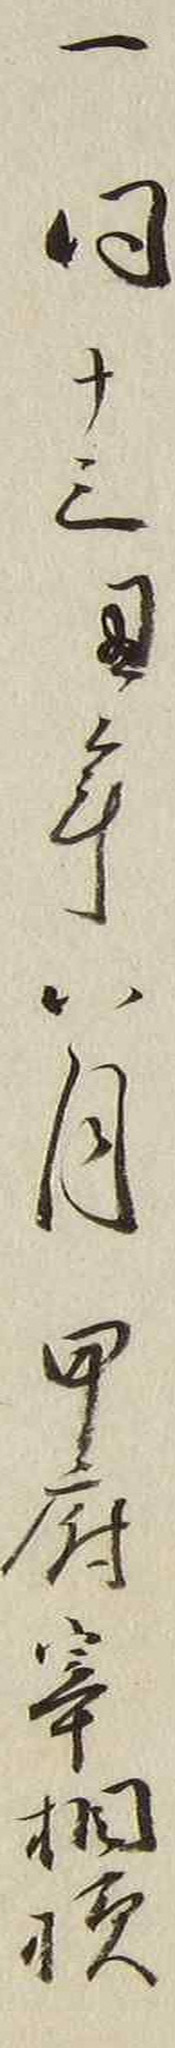一同十三丑年八月甲府宰相様
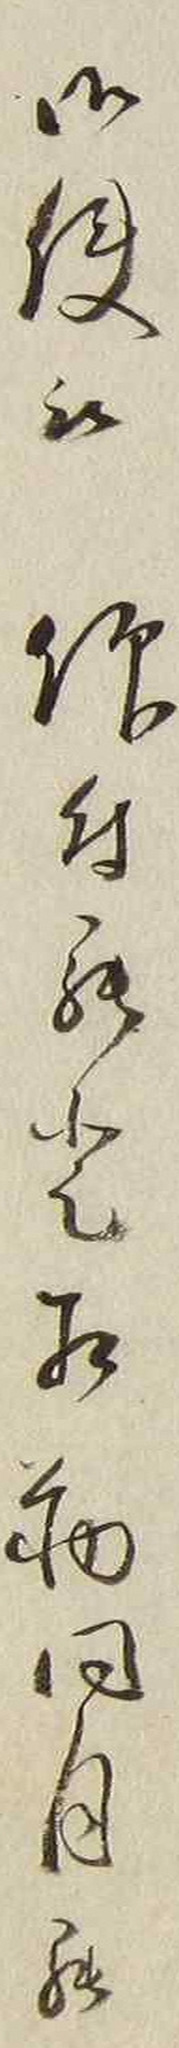御使被仰付罷登相勤同月罷

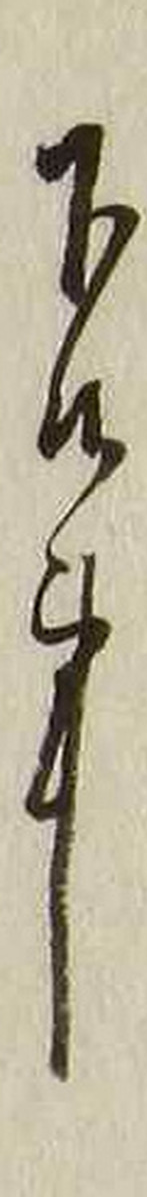下候事
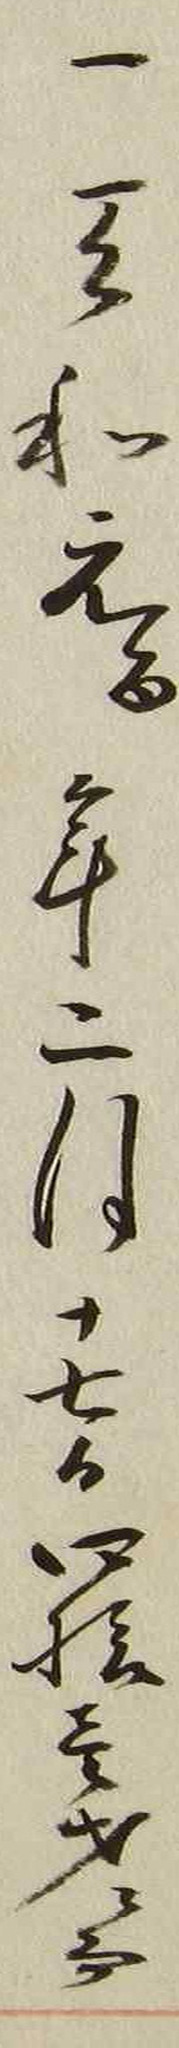一天和元卯年二月十七候四拾壱才ニに而
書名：諸士系譜　巻之159　な之部1
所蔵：会津若松市立会津図書館
